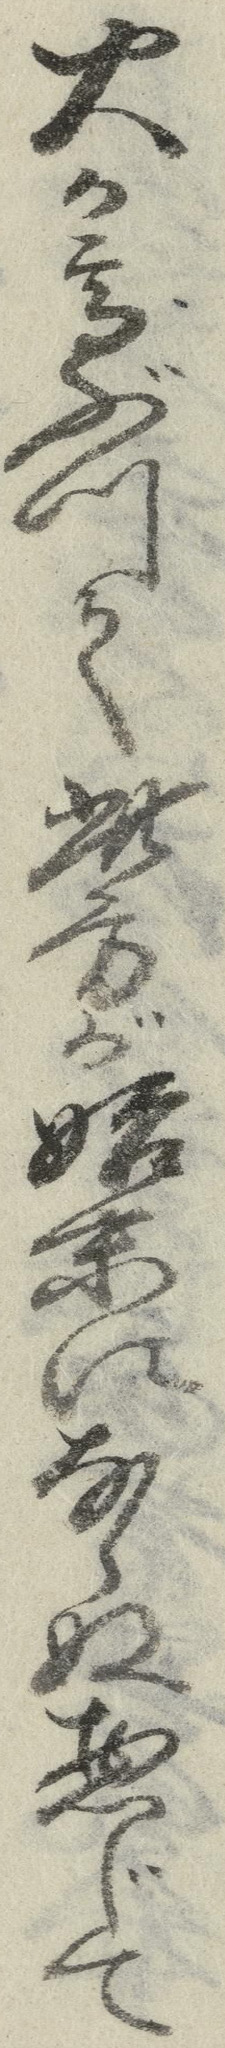火か高ふつて此方が始末にならぬ惣じて
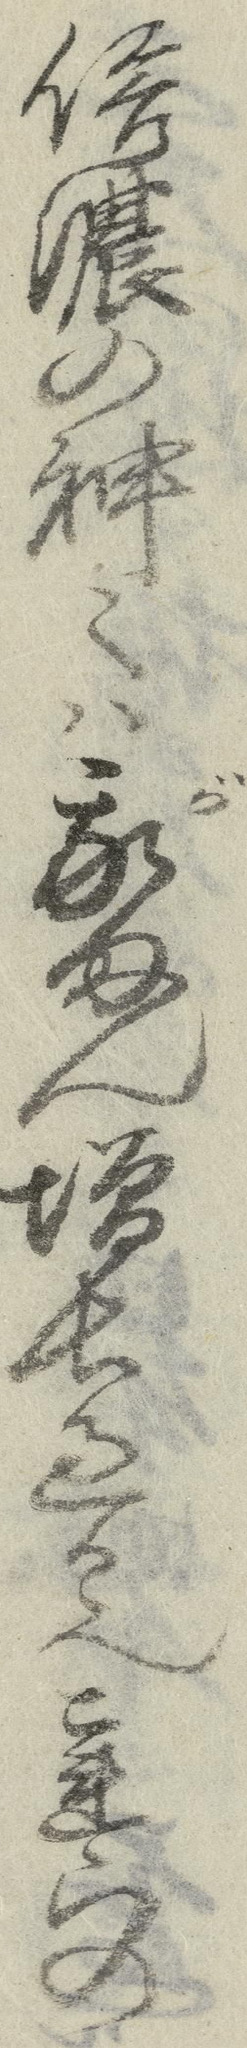信濃の神々は我まん増長過る也これらの
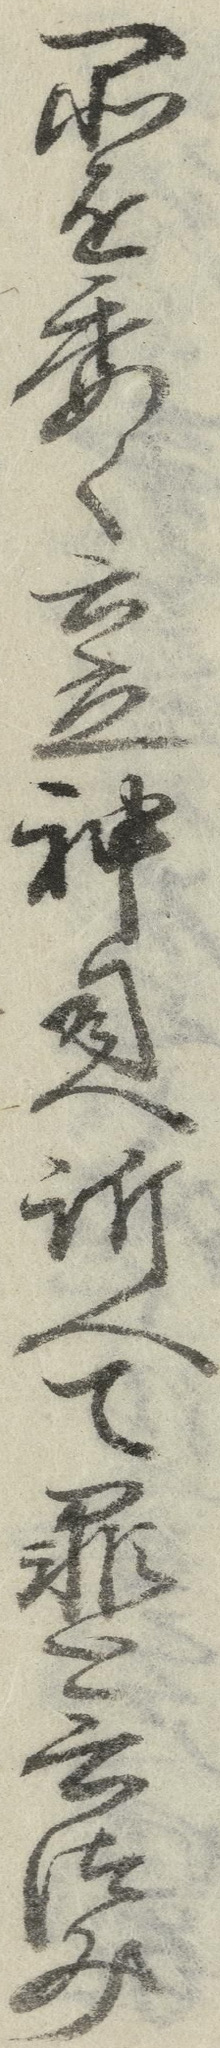品を委く云立神司へ訴へて罪と云つみ
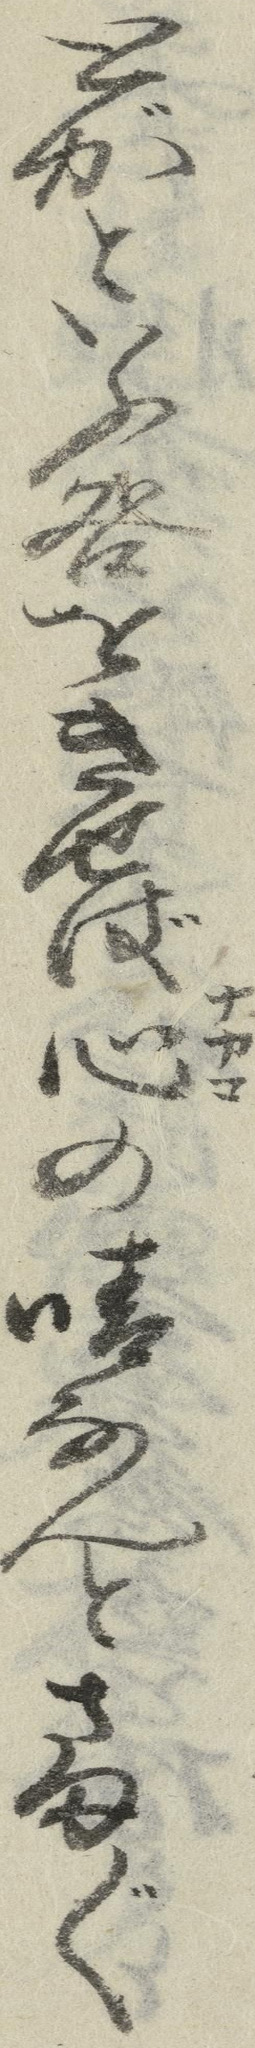とがといふ咎をきせば心の晴なんとさま〳〵
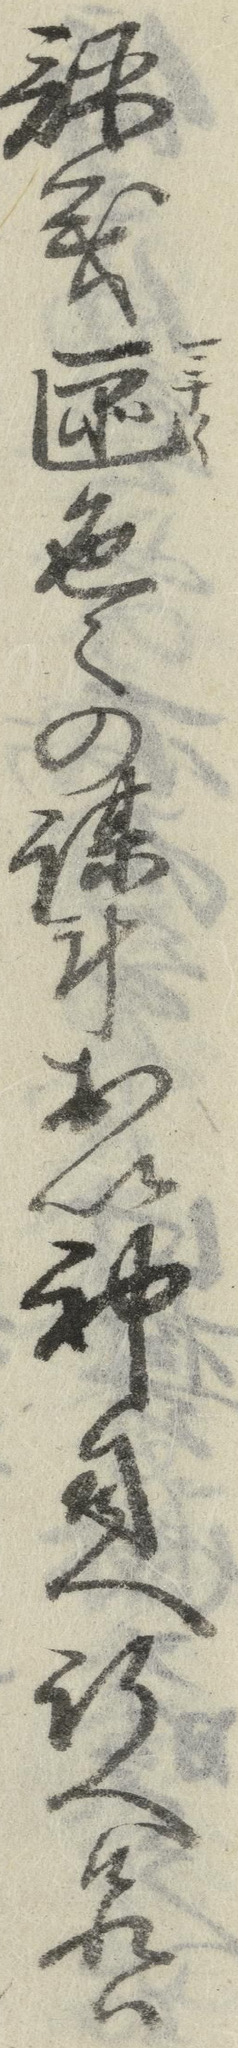評義區色々の謀計おい神司へ訴へけれは
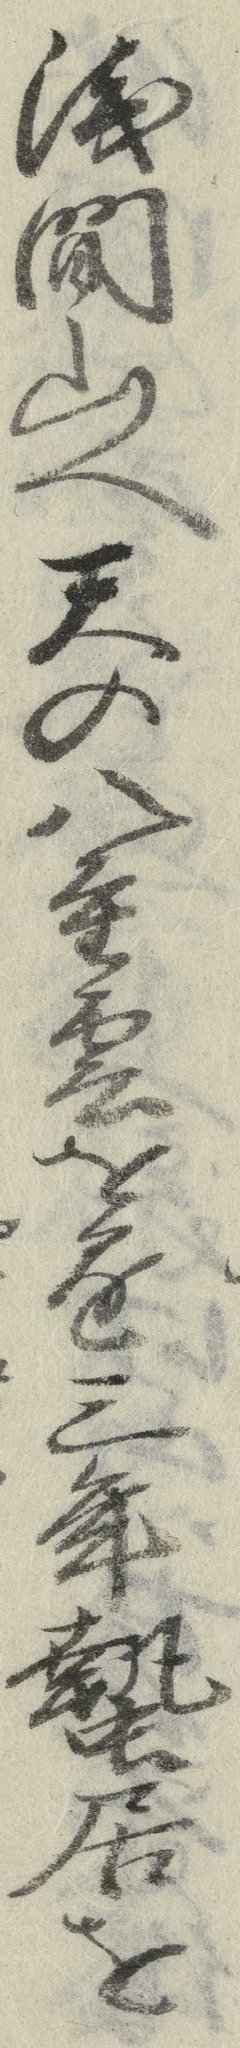浅間山へ天の八重雲を懸三年蟄居を
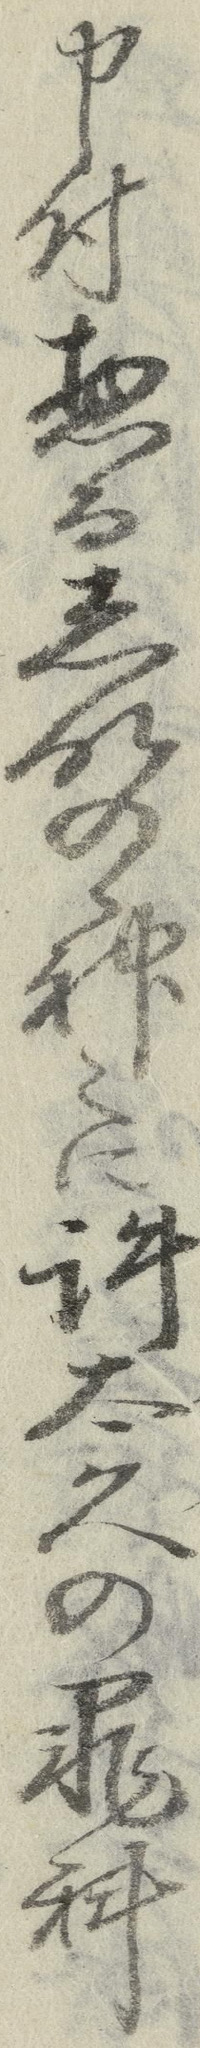申付惣而しなのゝ神々に許太久の罪科
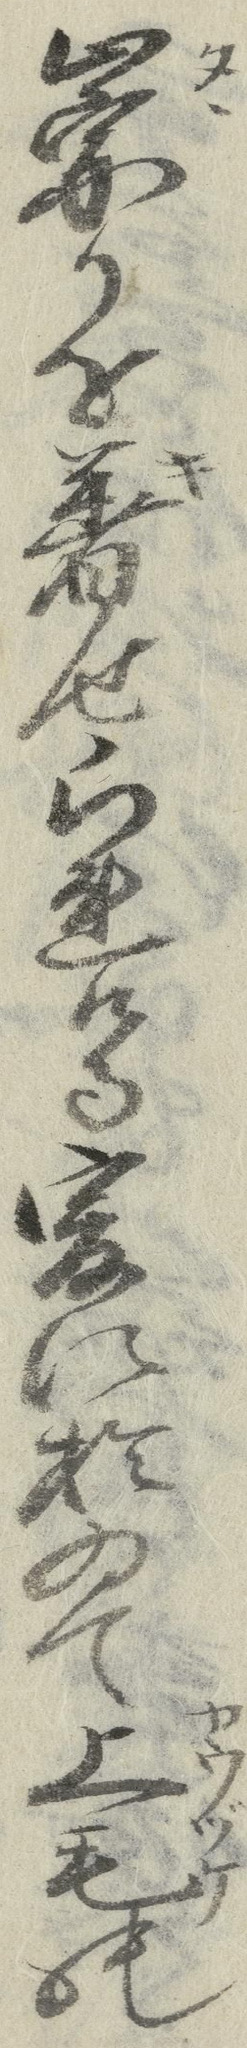祟りを着せられける爰におゐて上毛の
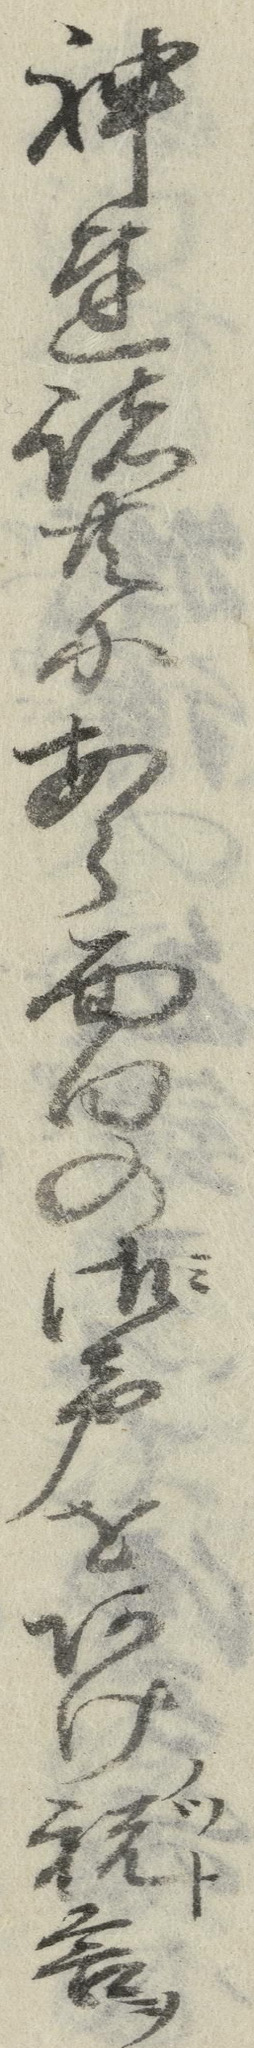神達諸共にあら面白の御声をあげ祝言ヲ
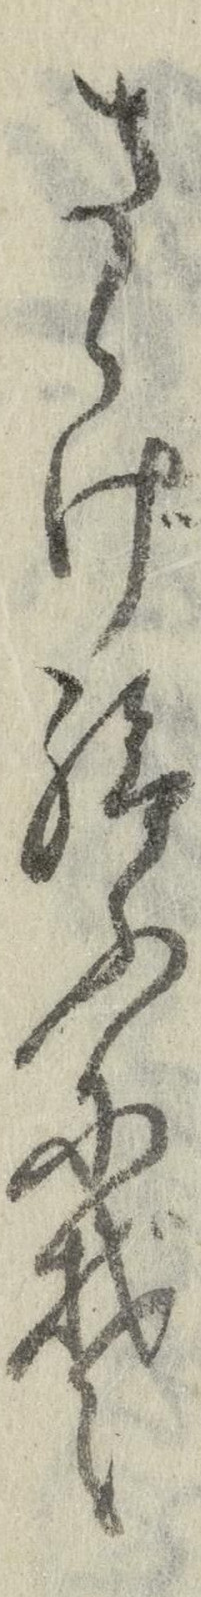さゝげ給ふにぞ

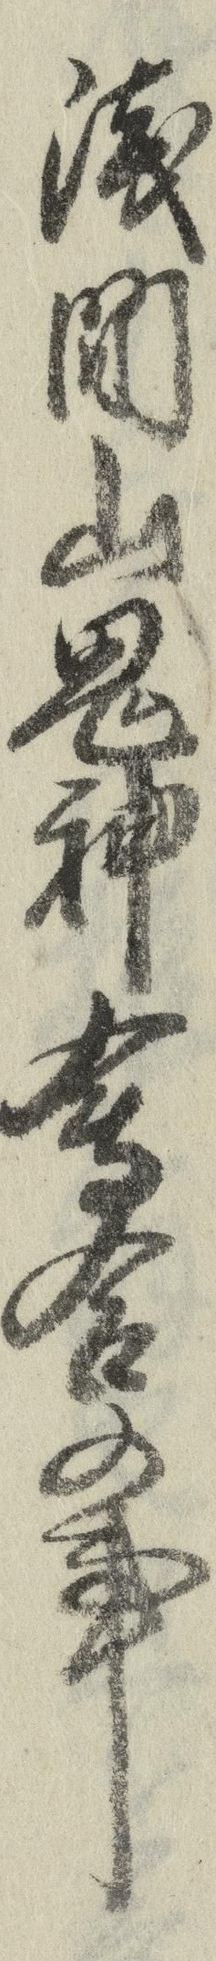浅間山鬼神会合の事
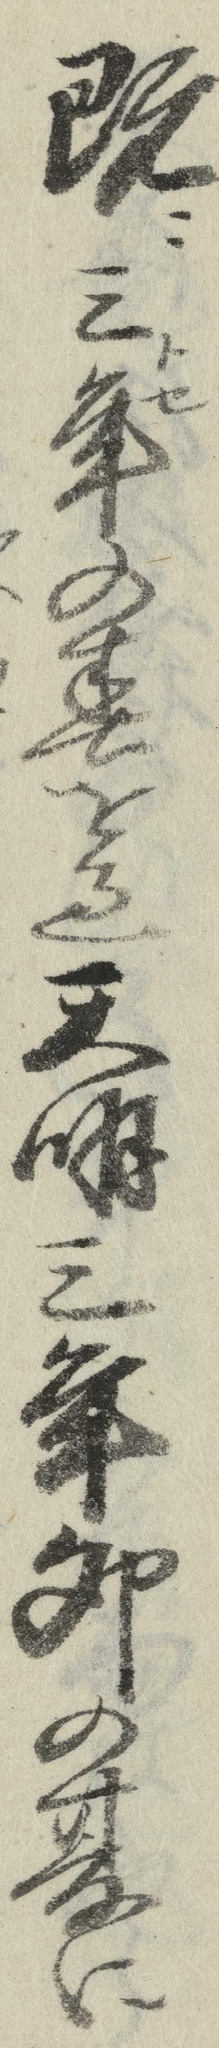既に三年の春を過天明三年卯の夏に
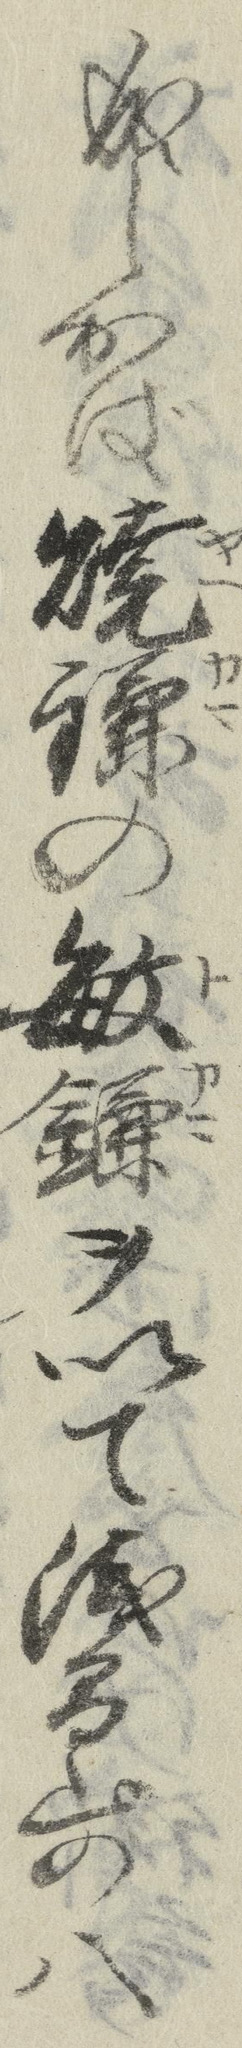成しかば焼鎌の敏鎌を以浅間山の八
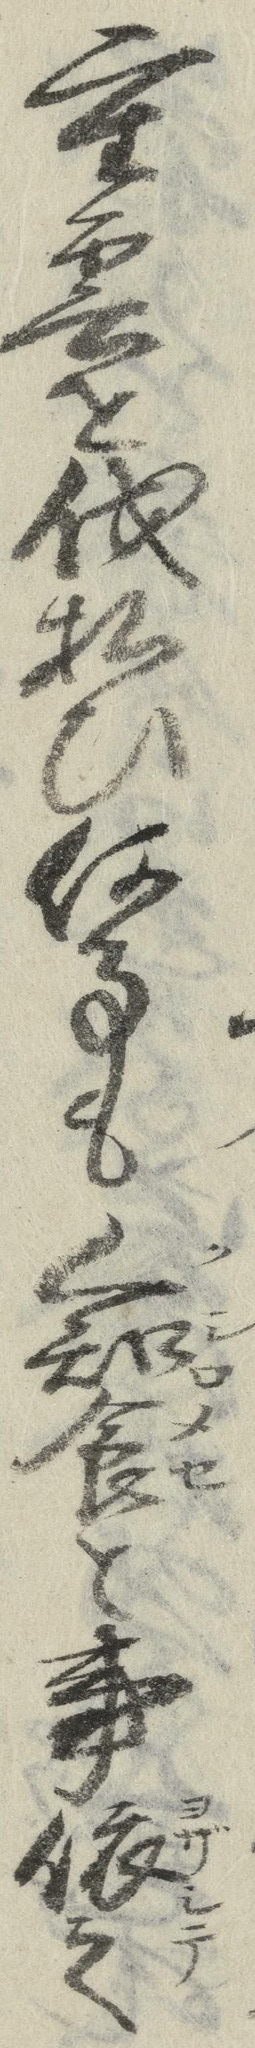重雲を伐払ひ何事もく知食と事依て
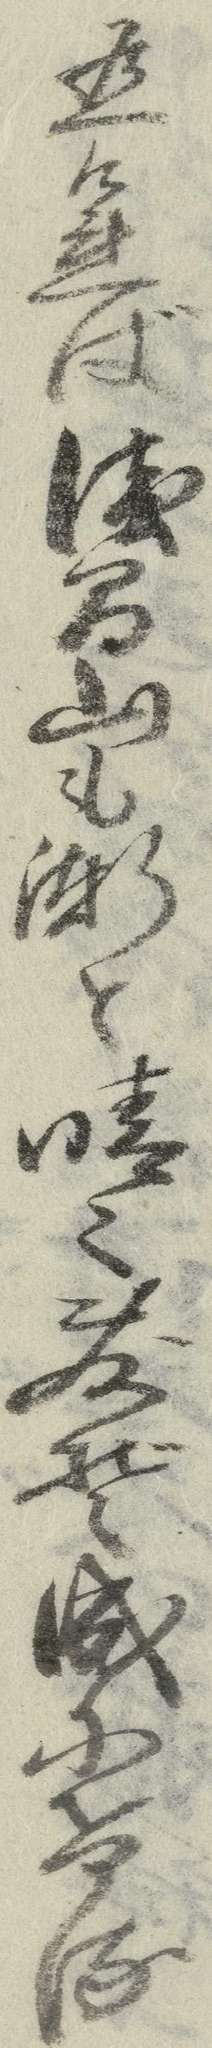有ければ浅間山も漸と晴々敷ぞ成にける
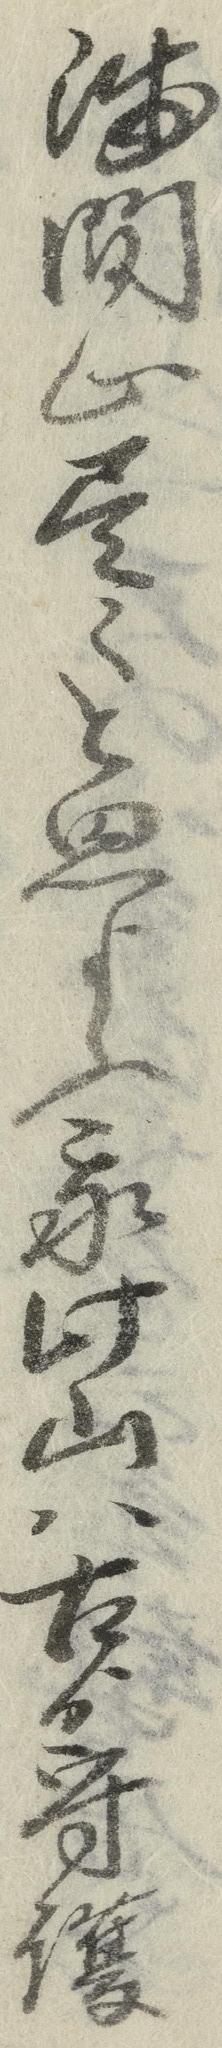浅間山尽々と思よふ我此山は古ゟ守護
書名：浅間大焼騒動記　上
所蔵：東京大学地震研究所図書室 Earthquake Research Institute Library, The University of Tokyo, JAPAN
